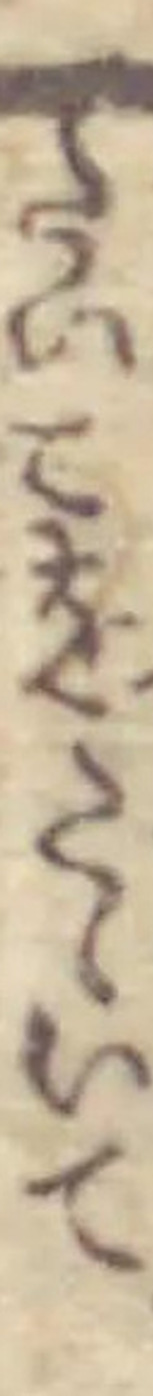たいこをたゝいて
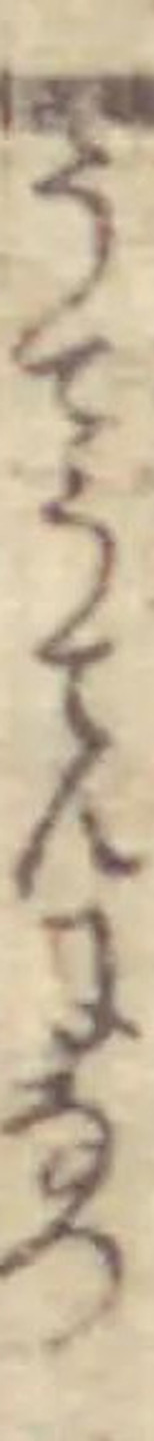うてうてんになつ
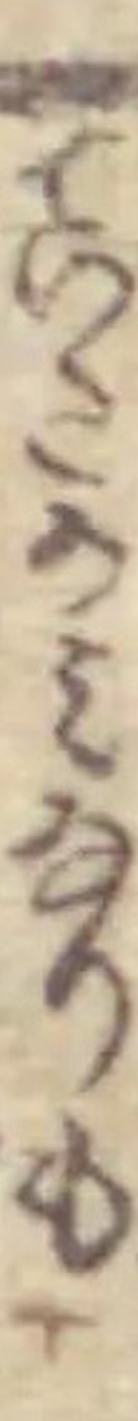ていたかみなりも
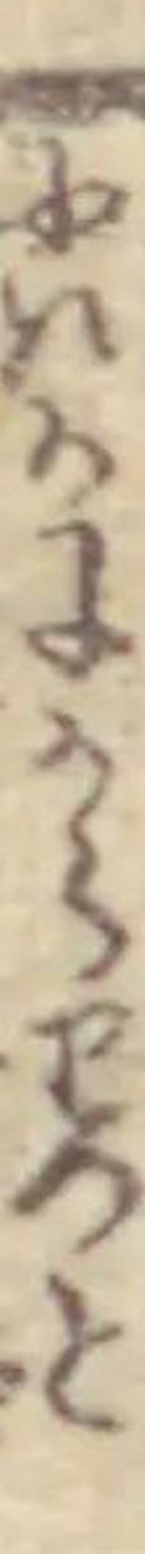にはかにからりつと
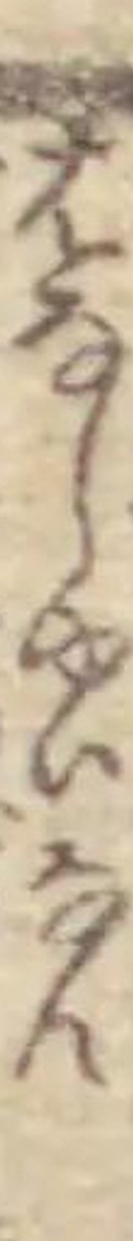はなしやいなん
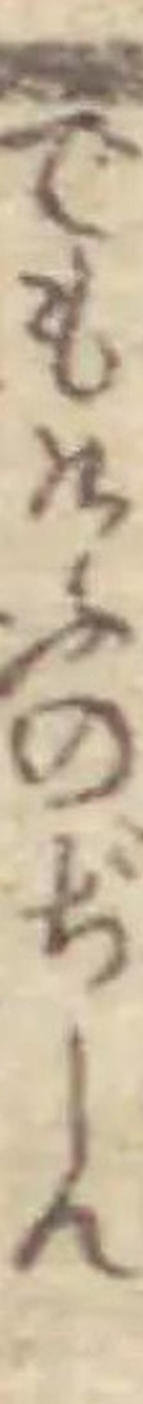でもけふのぢしん
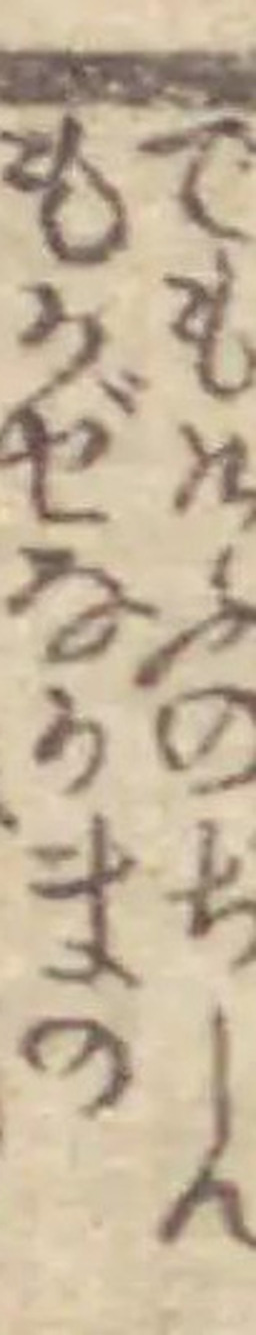もかぜなかまの
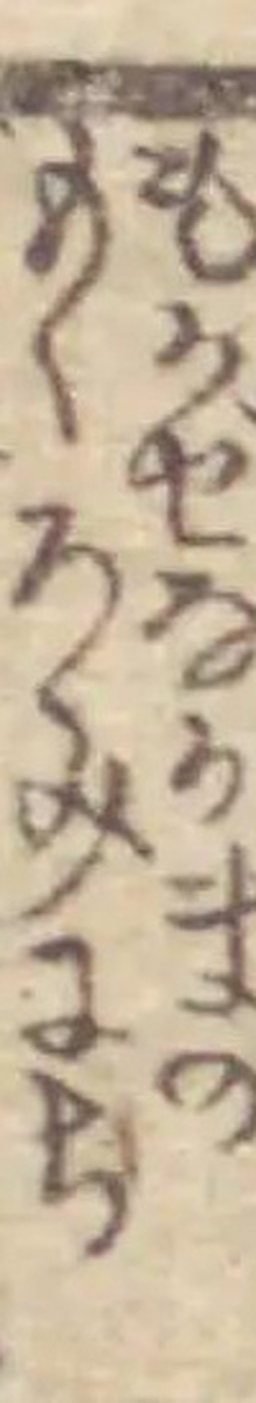もくろみにち
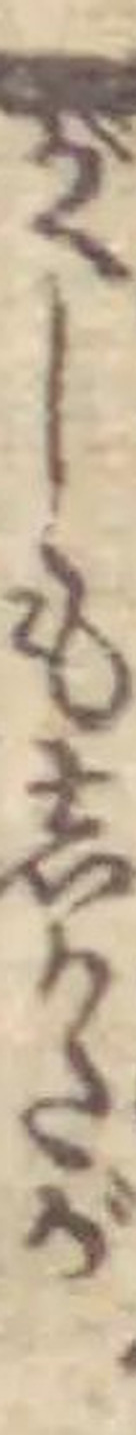がへしもしかたが
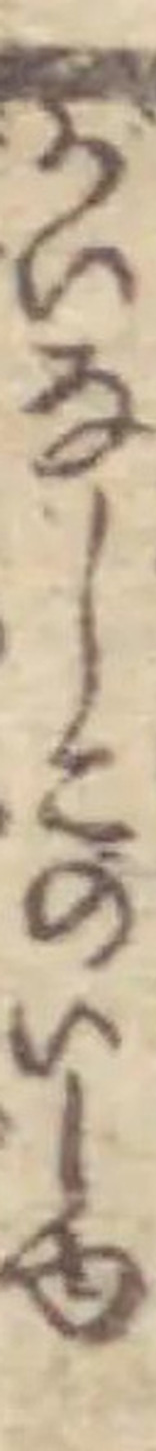がいなしこのいしゆ
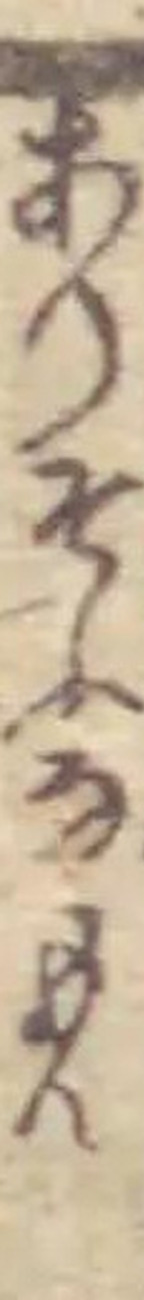ありそふなもん
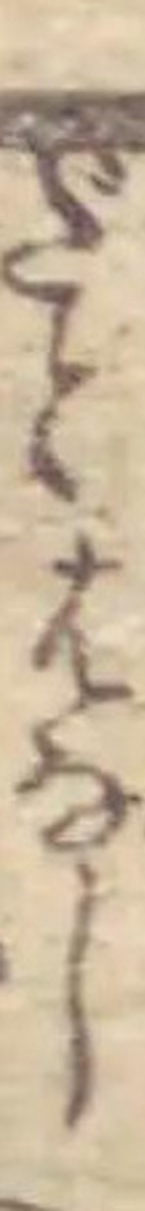だとはなし
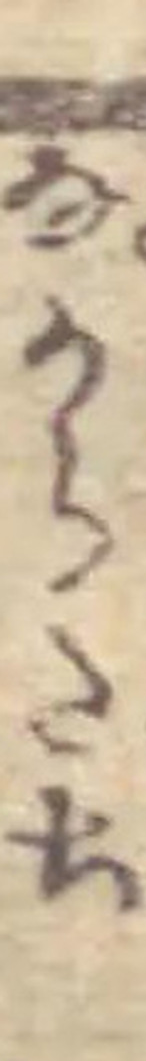なからたち
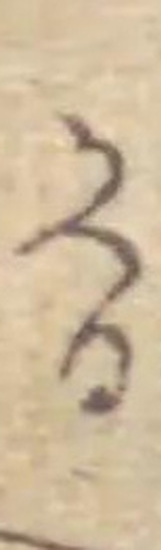かへる

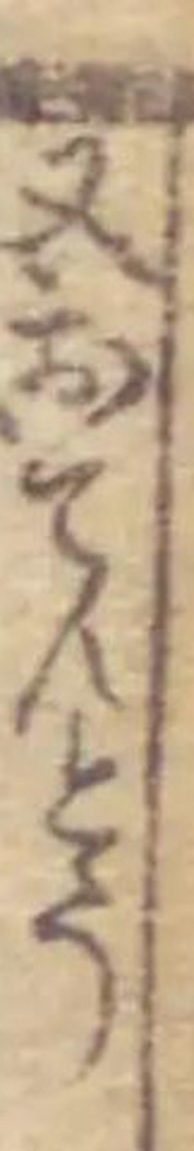又おてんとう
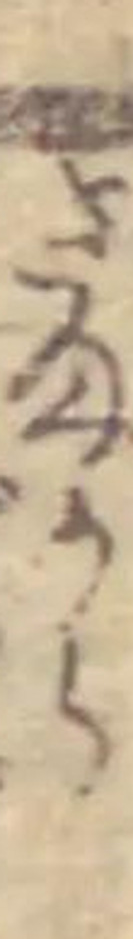さまから
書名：雨宮風宮出儘略縁記 3巻
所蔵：国立国会図書館 National Diet Library, JAPAN
